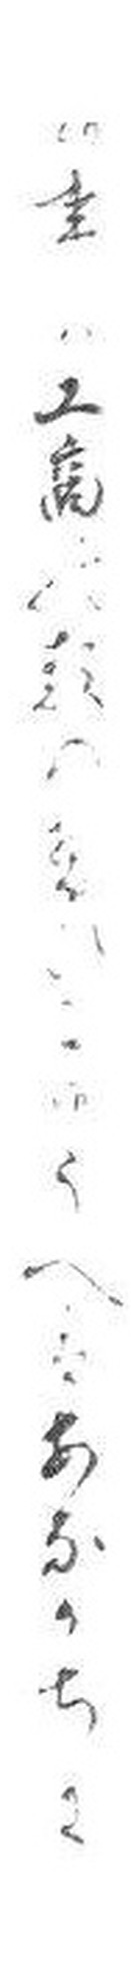候事ハ工商の類の習ひニ候うへはあなかちに
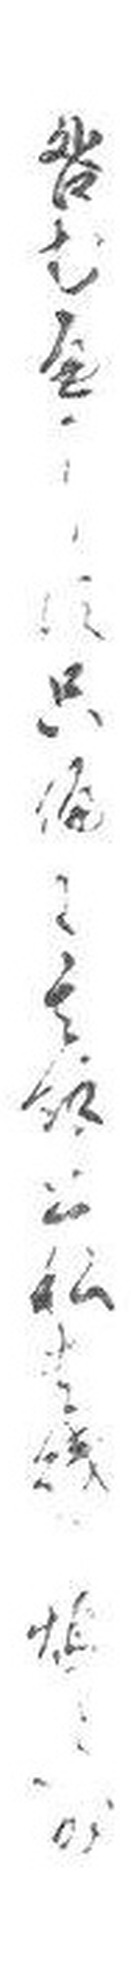咎むへからす只偏に其余公私貴賤の煩と成
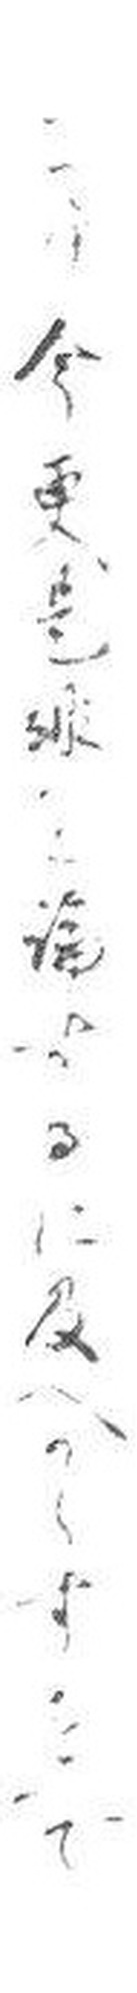候事今更是非を論するに及へからすすへて
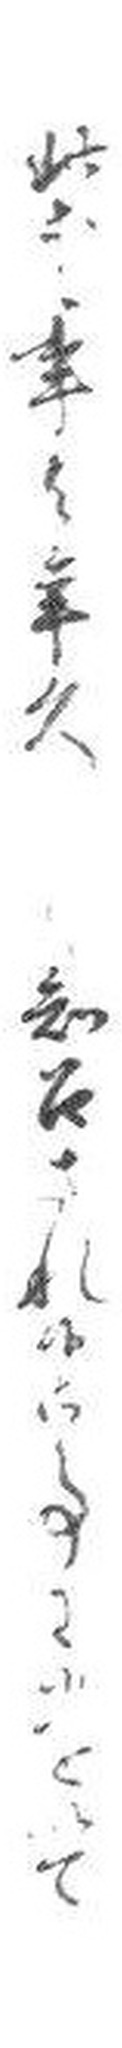此等之事共年久しく知召され候御事に候を以て
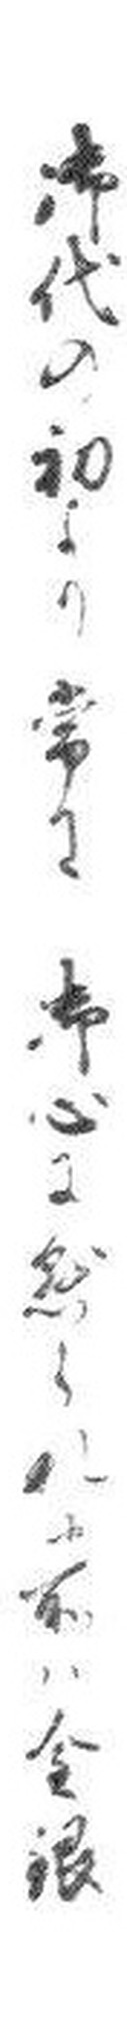御代の初より常に御心に懸けられ候所ハ金銀
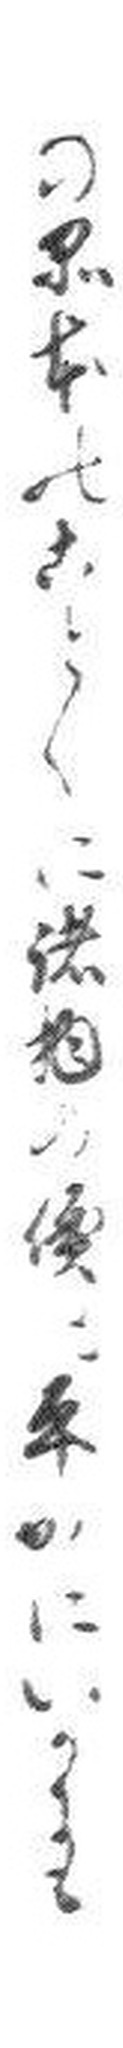の品本のことくに諸物の價も平かにいかにも
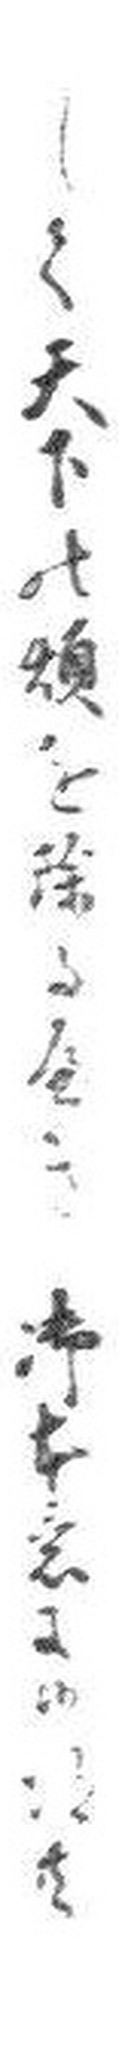して天下の煩を除るへき御本意に候得共
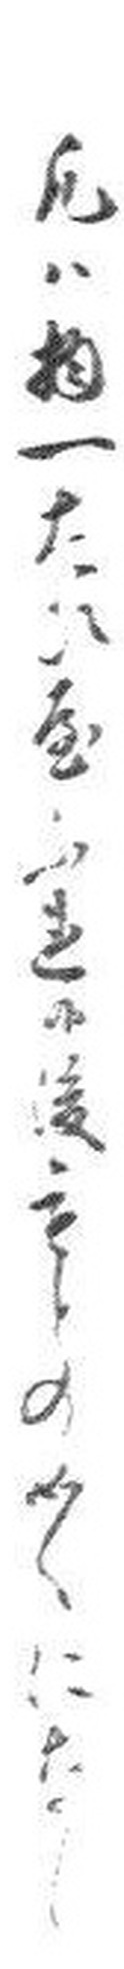凡ハ物一たひやふれ候後もとの如くになし
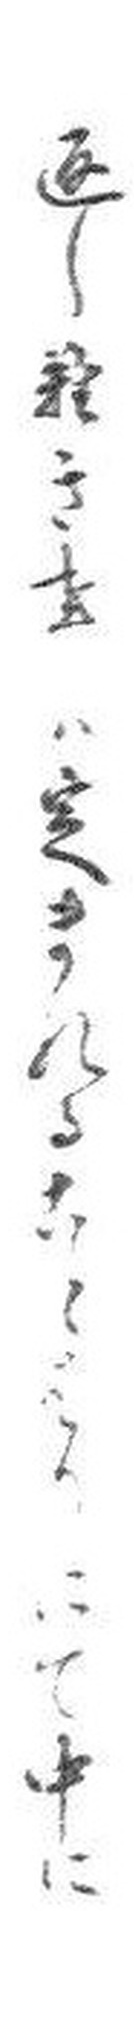返し難き事ハ定まれることはりにて中に
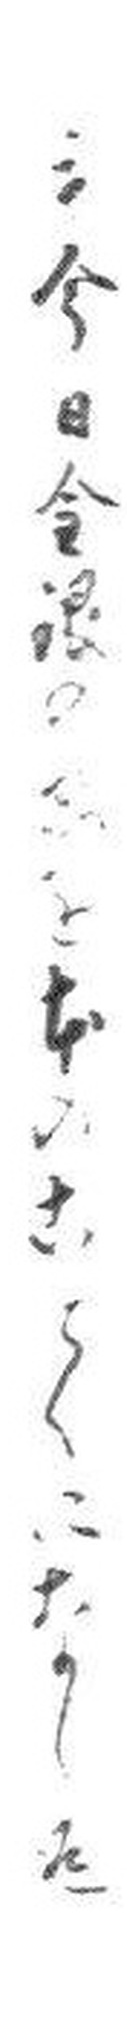も今日金銀の品を本のことくになし返
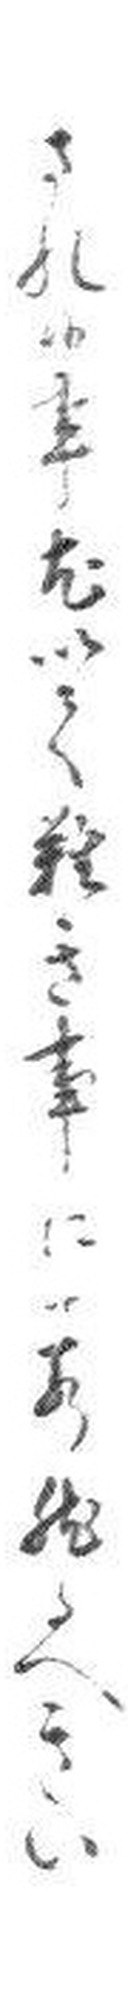され候事尤以て難き事に候若然るへきい
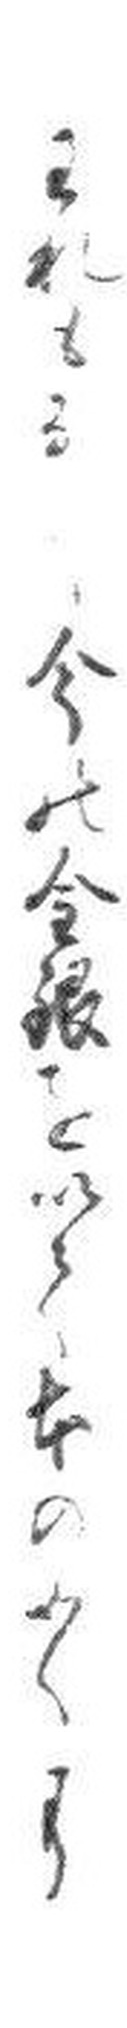われもなく今の金銀を以て本の如くに
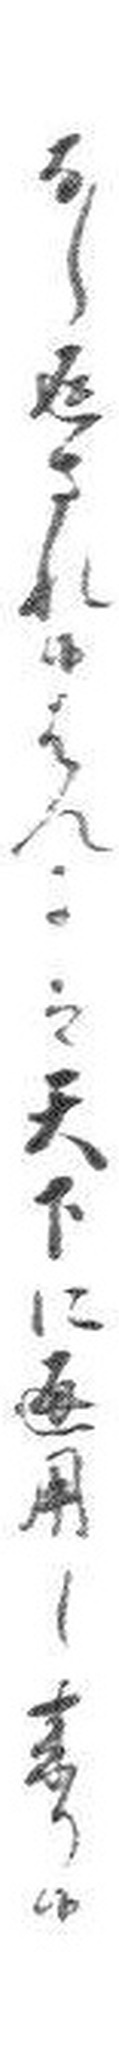なし返され候はんには天下に通用し来り候

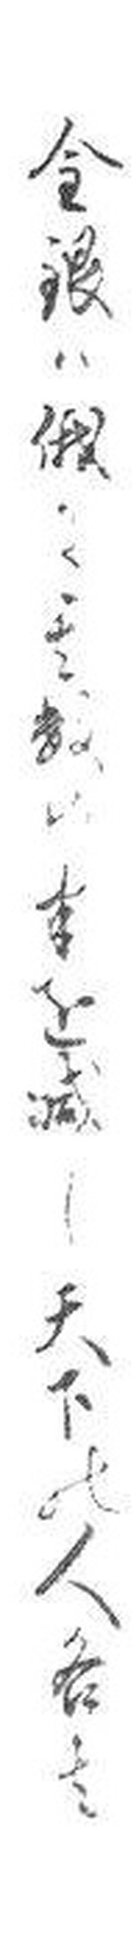金銀ハ俄に其数の事を減し天下の人各者
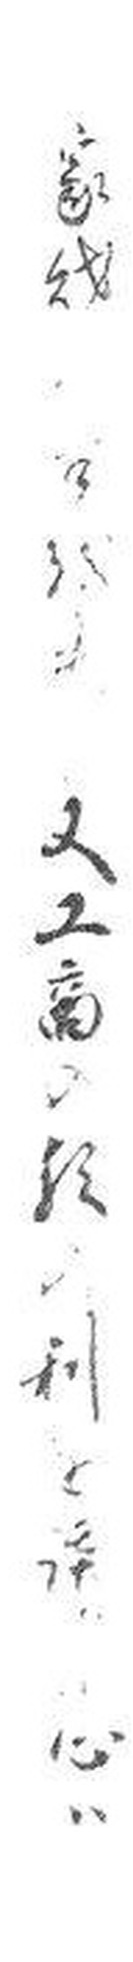家財の半を失ひ又工商の類の利を謀り心ハ
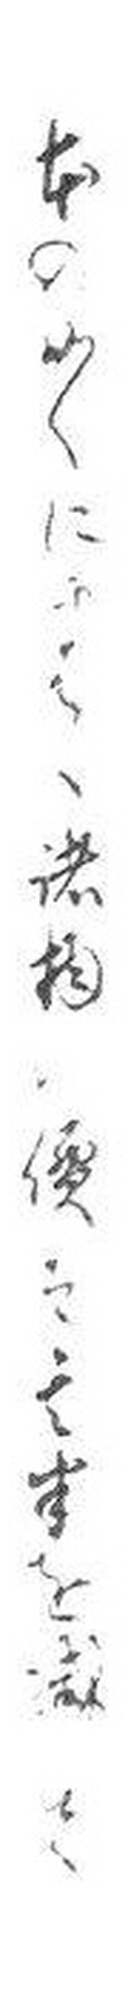本の如くに候はゝ諸物の価は其半を減して
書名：家譜 二十九 吉邦公 従正徳二年到正徳三年
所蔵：福井県文書館 Fukui Prefectural Archives
